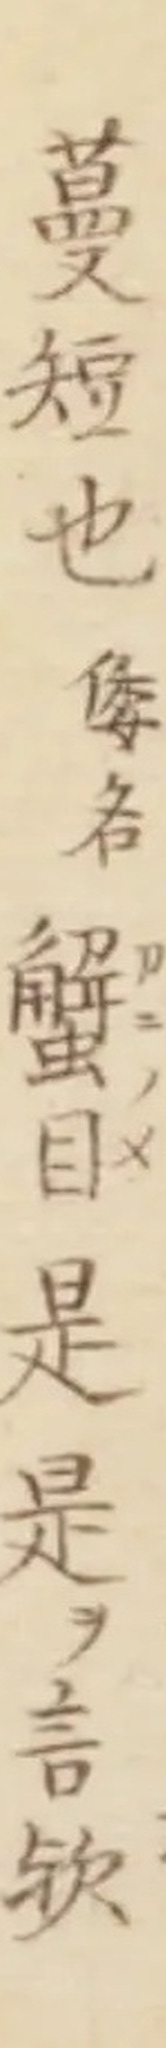蔓短也倭名蟹目是是を言欤
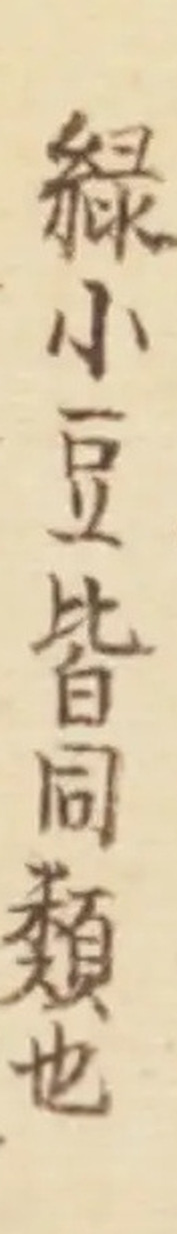緑小豆皆同類也
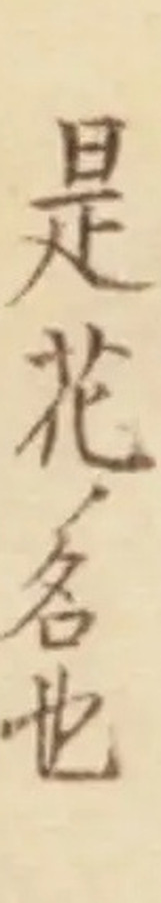是花の名也
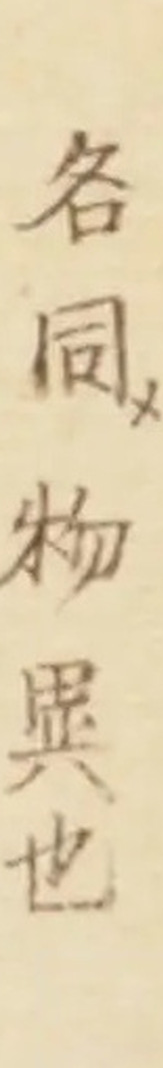名同め物異也
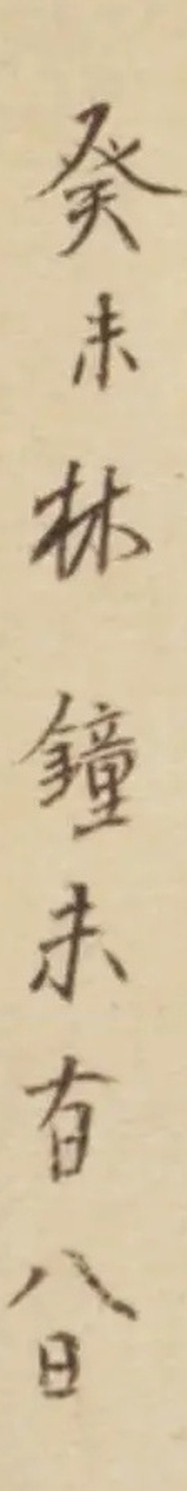癸未林鐘未有八日
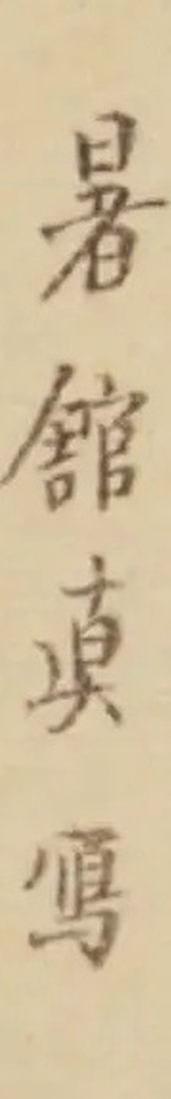暑館真寫

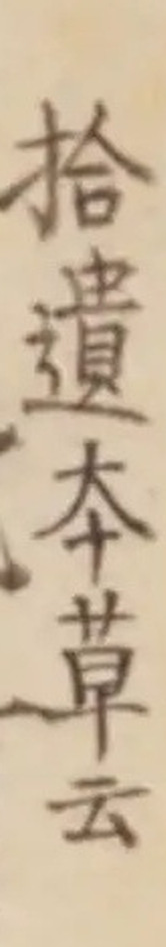拾遺本草云
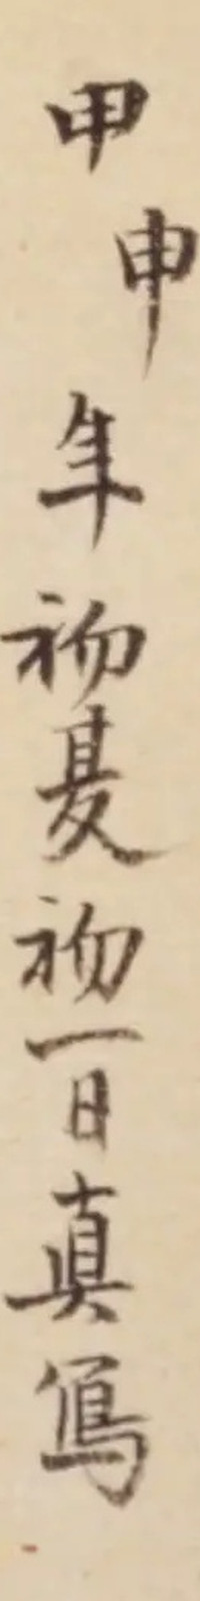甲申年初夏初一日真寫
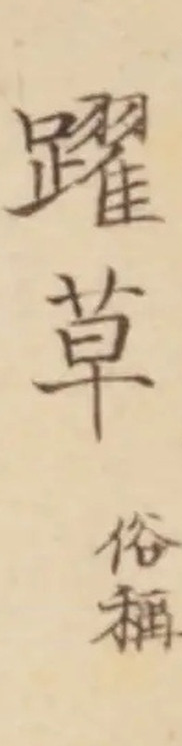躍草俗稱
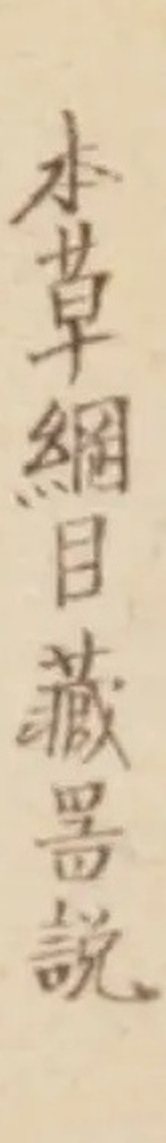本草綱目蔵圖説
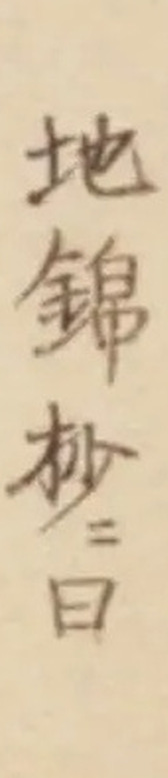地錦抄に曰
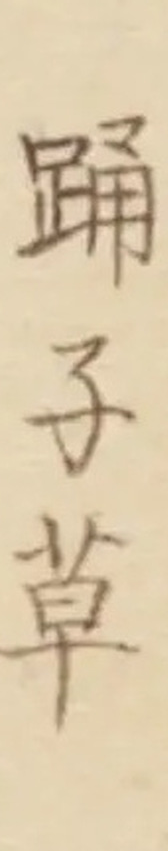踊子草
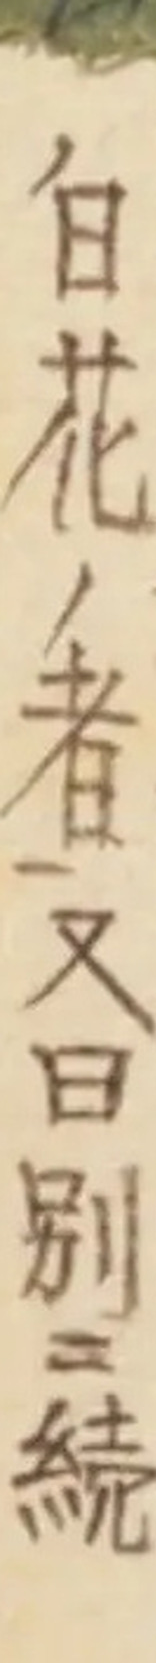白花の者又曰く別に続
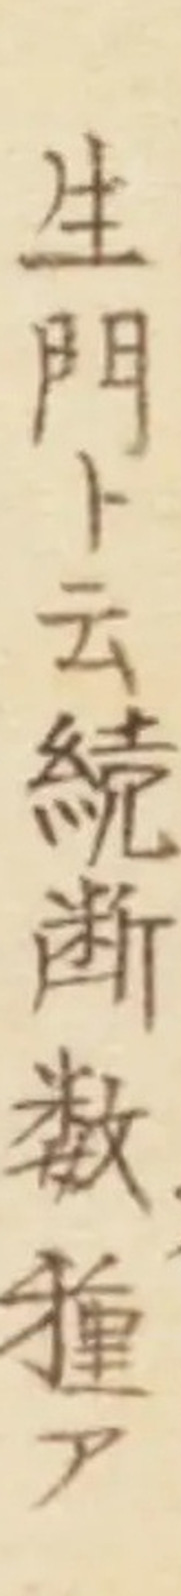生門と云続断数種あ
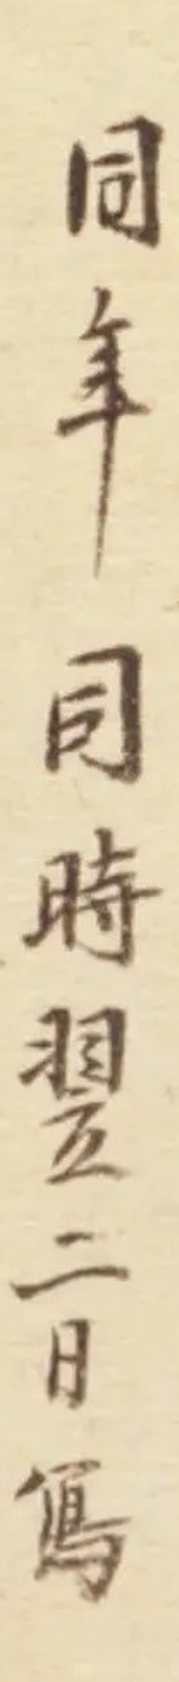同年同時翌二日寫
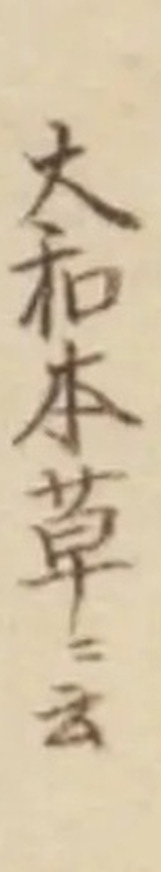大和本草に云
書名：梅園草木花譜夏之部. 2
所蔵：国立国会図書館 National Diet Library, JAPAN
